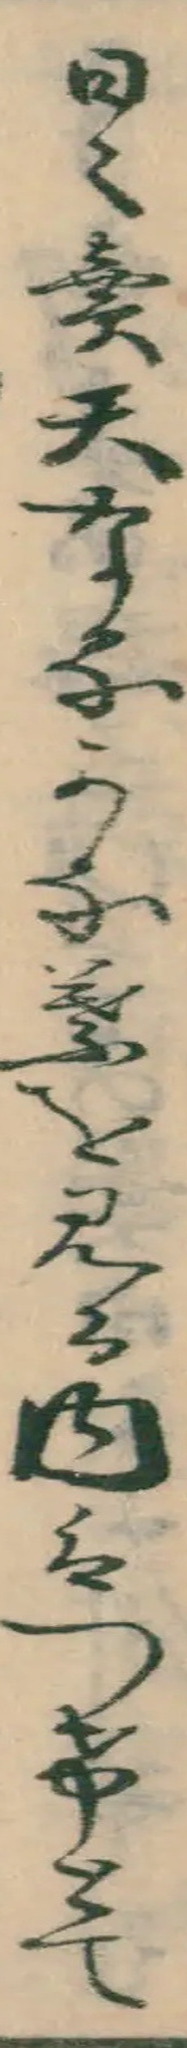日々売天なるかる葉を見る内はつけとて
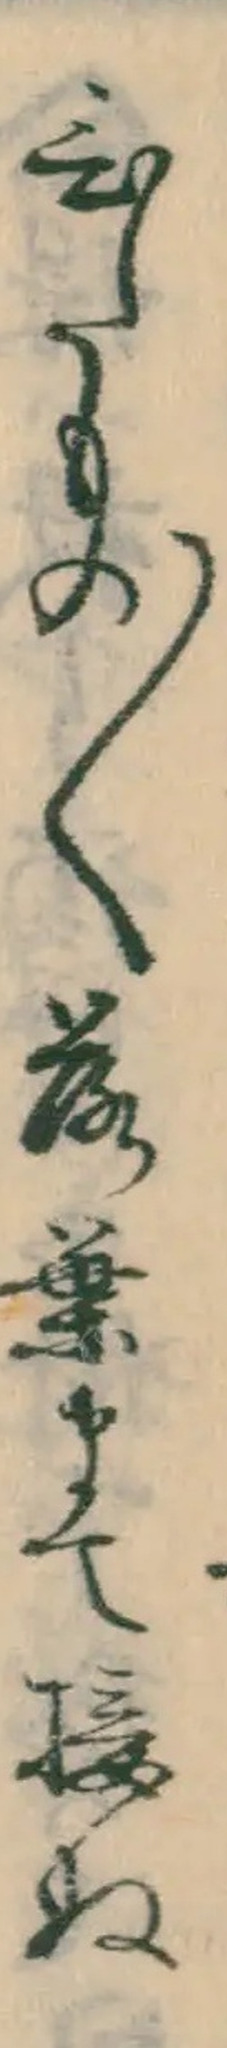ひたもの〳〵落葉まて接ぬ
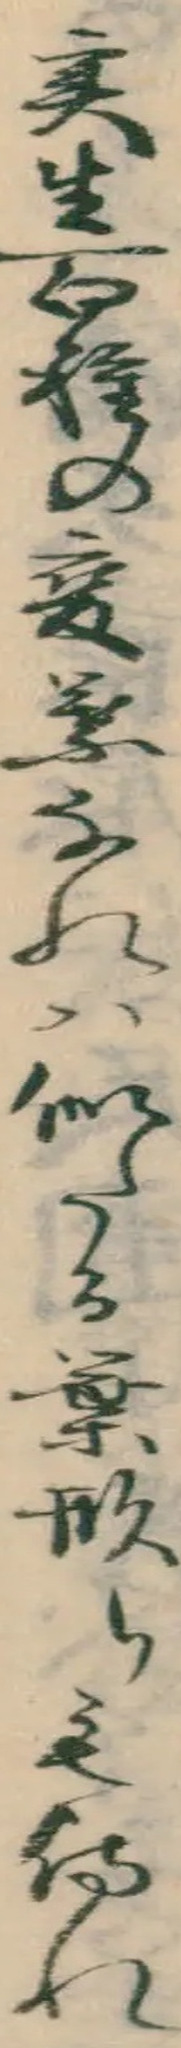実生百種の変葉なれは似たる葉形にも侍れ
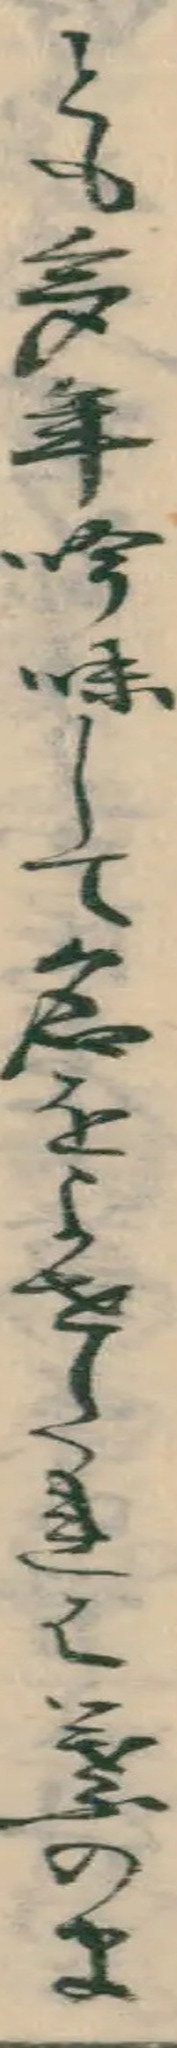とも多年吟味して名をよせたれは葉のま
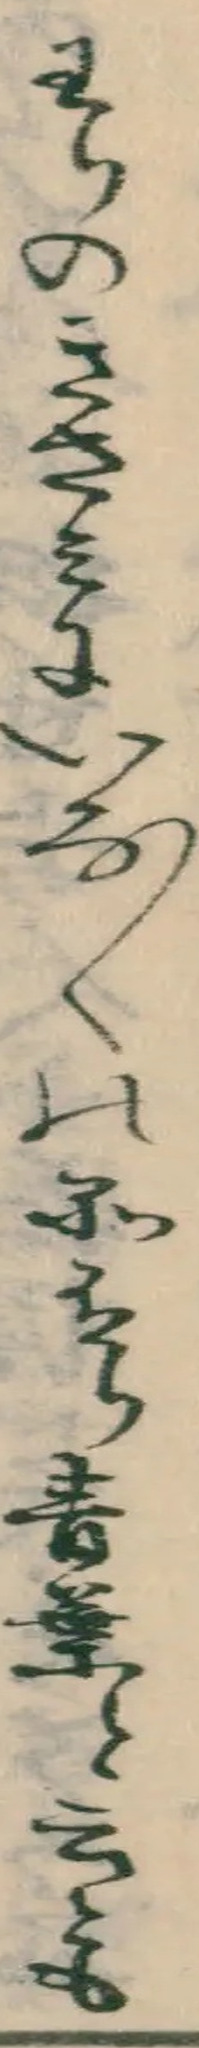わりのきさみにいろ〳〵の品有り青葉と云とも
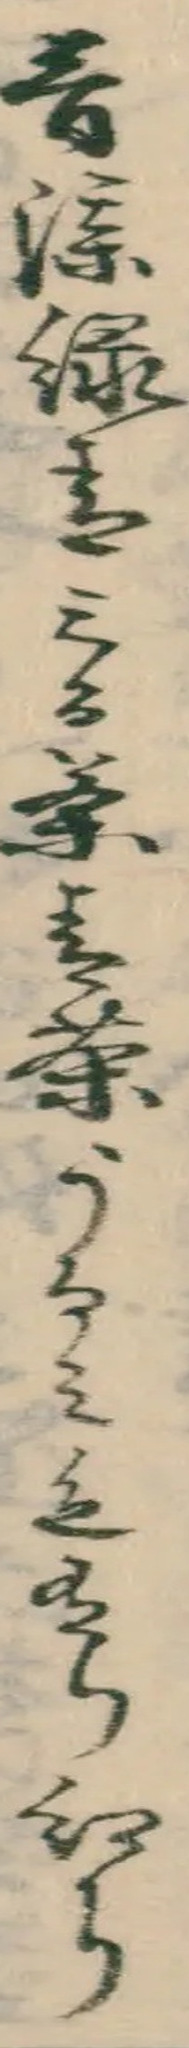青漆緑青みる茶青茶うるみ色有り紅に
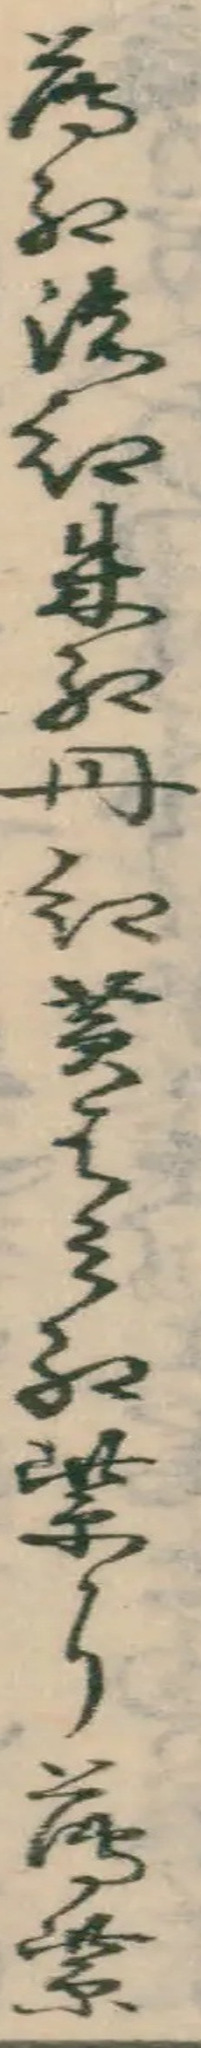薄紅濃紅朱紅丹紅黄はみ紅紫に薄紫
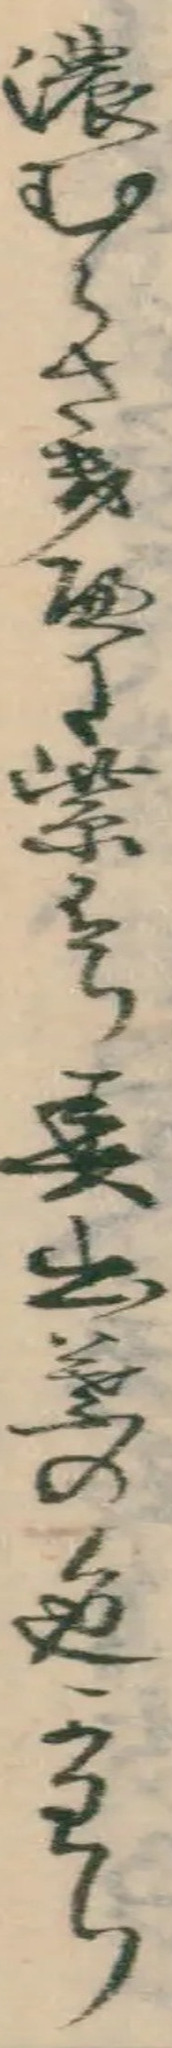濃むらさきへに紫有り春出葉の色かわり
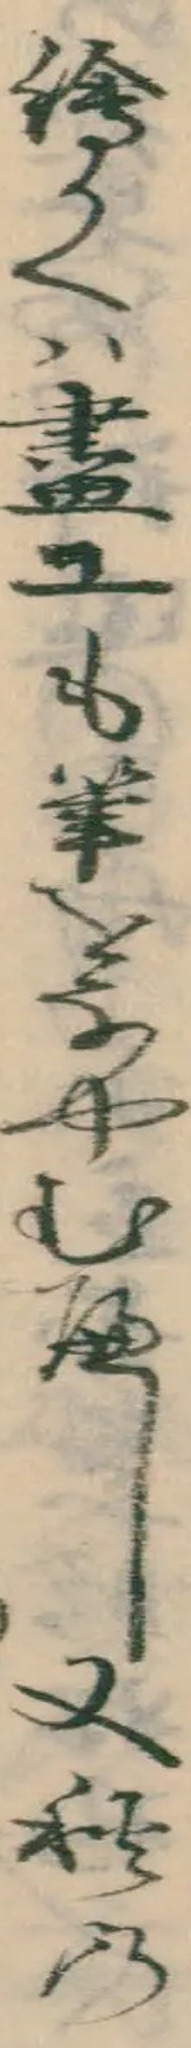絵かくは畫工も筆をなやむへし又秋の
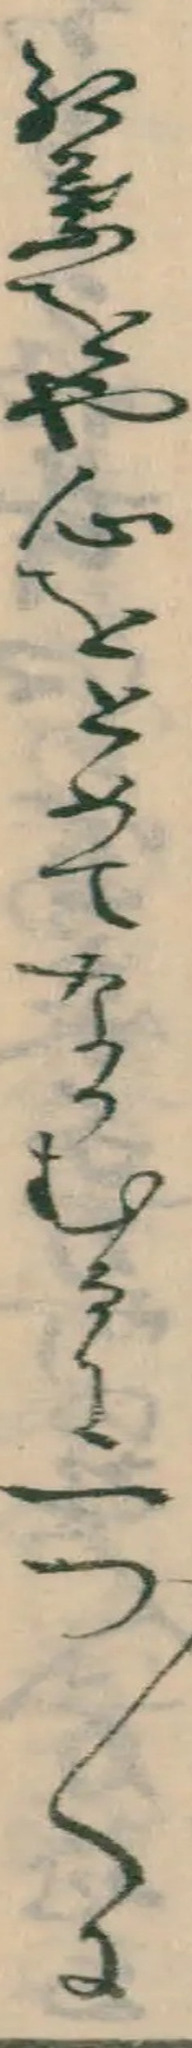紅葉をや心をとめてなかむるに一つ〳〵に
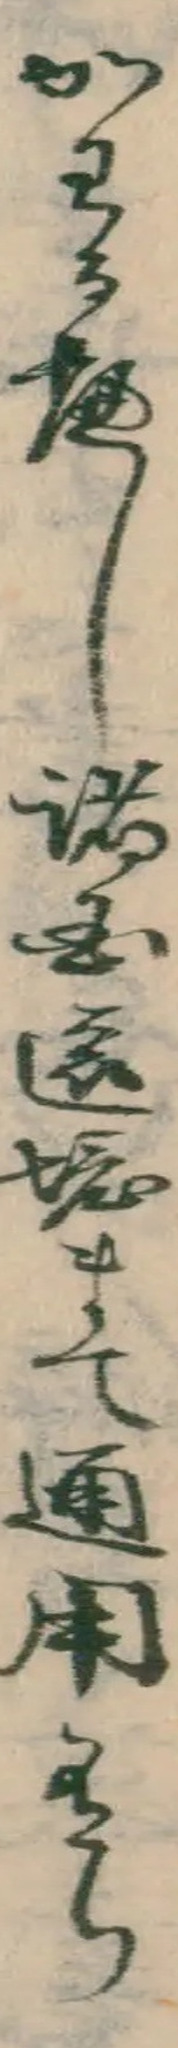かわるへし諸国遠境まて通用有り
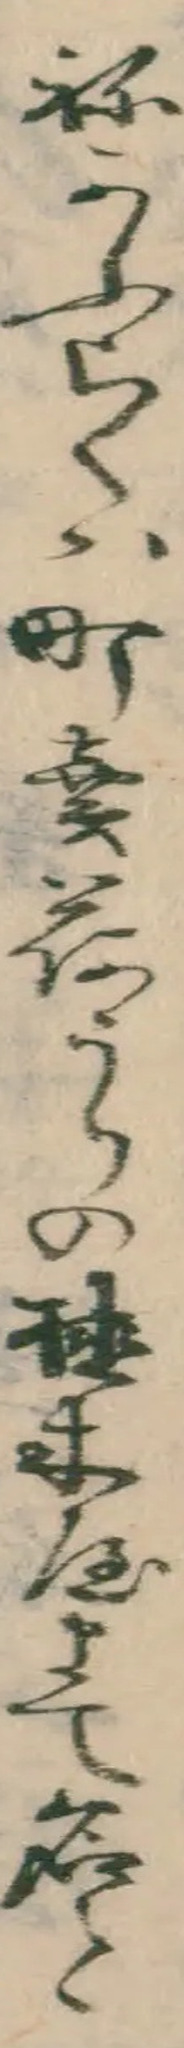ねかふらくば町売荷うりの植木屋まて名と
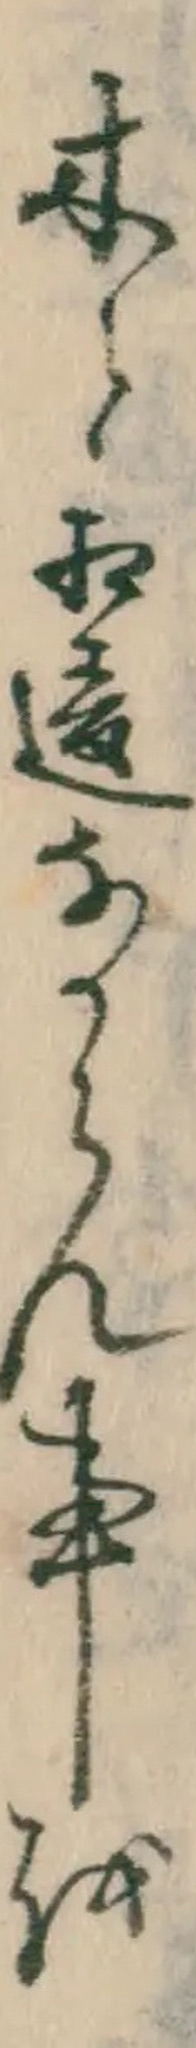木と相違なからん事を
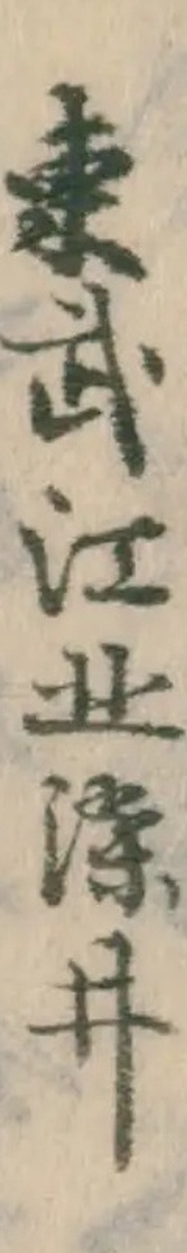東武江北染井

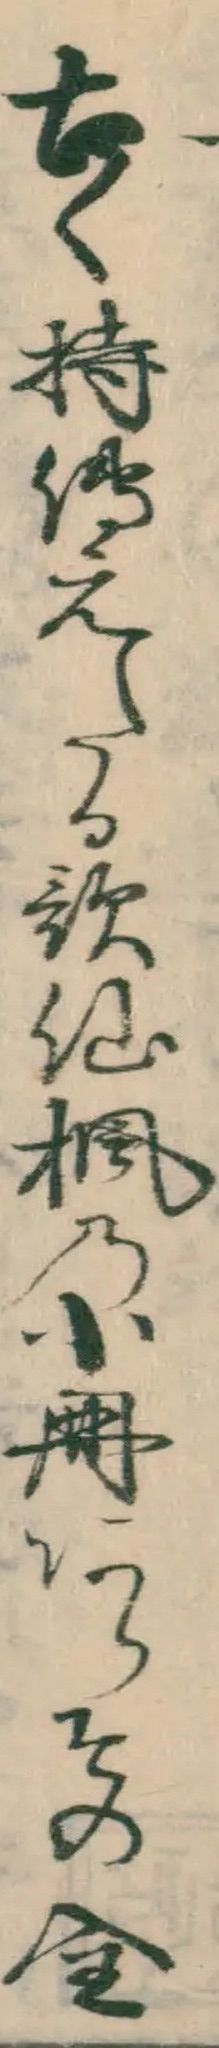古く持伝えたる歌仙楓の小冊ありその全
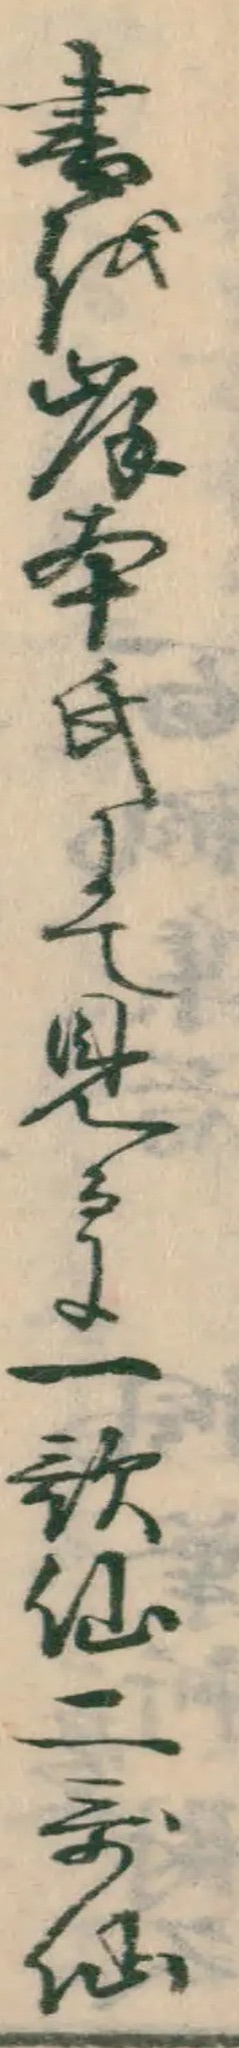書を岸本氏にて見るに一歌仙二歌仙
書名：紅葉集
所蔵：国立国会図書館 National Diet Library, JAPAN
